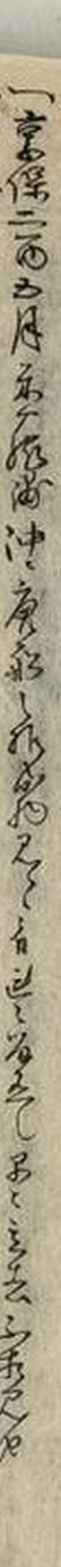一享保二酉五月米ケ脇浦沖ニ唐船之様成物見へ候ニ付連々留有之早々立去不相見由
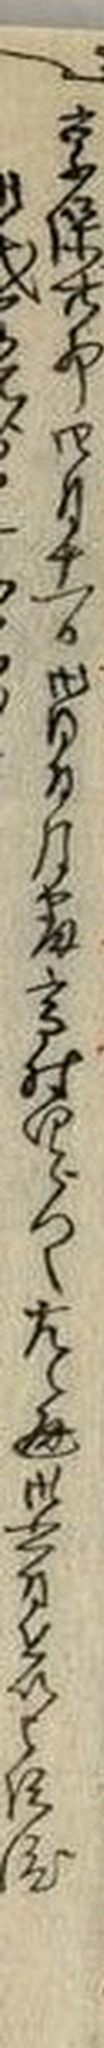一享保廿卯四月十一日御目付月番高村四郎右衛門左之通御書付を以被仰渡
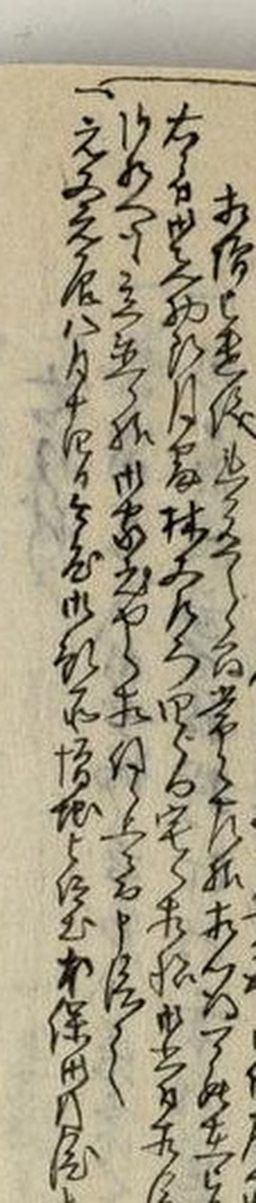弐拾人ツヽ立置候様御家老中へ相伺候上ニ而申渡之
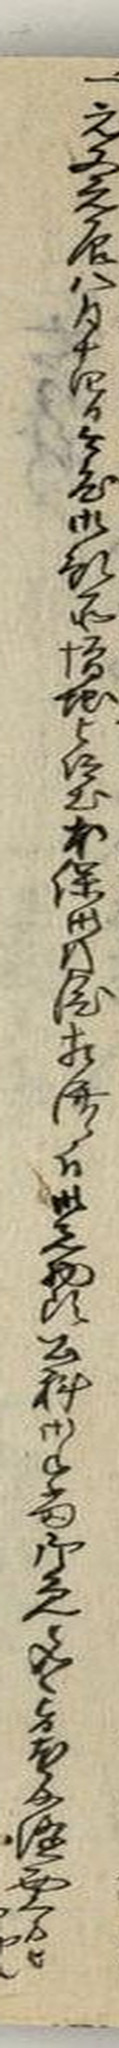一元文元辰八月十四日今度御領所増地被仰出本保御引渡相済候ニ付御先物頭公料御手当御免被成候旨本多縫殿方被申聞候

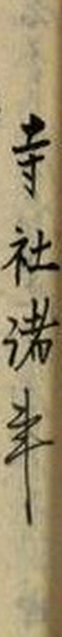寺社諸事
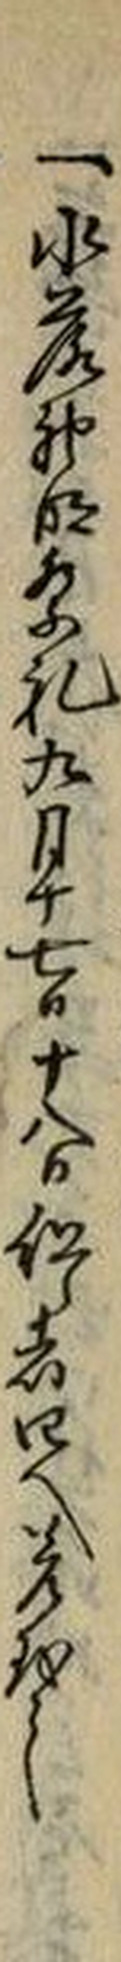一水落神明祭礼九月十七日十八日組之者四人差越之
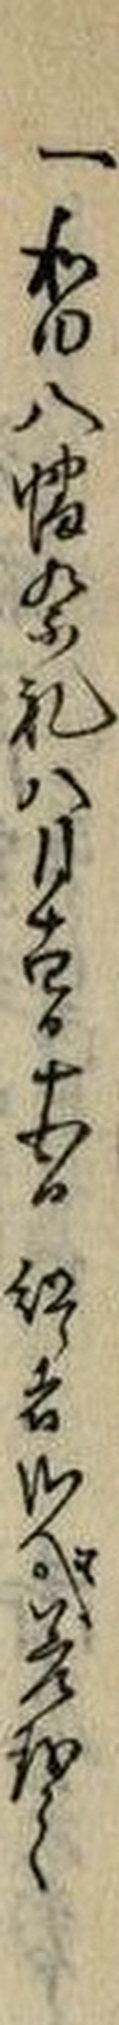一和田八幡祭礼八月十四日十五日組之者弐人差越之
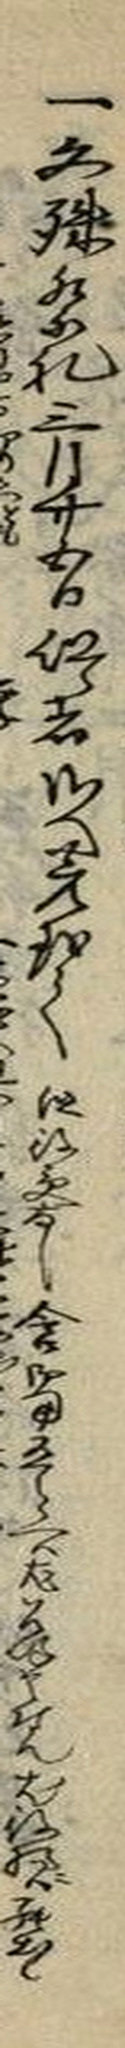一文殊祭礼三月廿五日組之者弐人差越之但役受なし含御用有之候へハ尤召呼申付ル尤役場ニハ罷出候
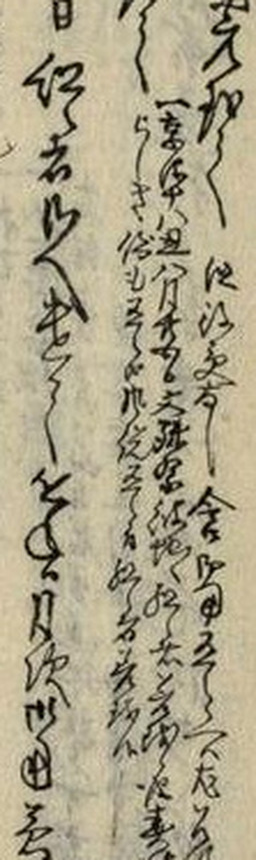らしき儀も有之哉風説有之ニ付組之者差越候
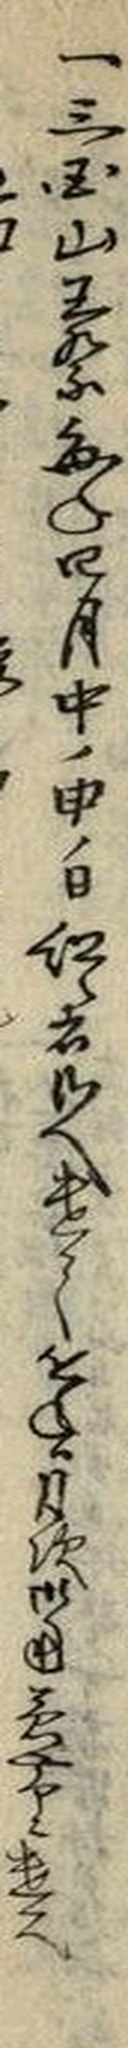一三国山王祭毎年四月中ノ申ノ日組之者弐人遣之近年ハ月次御用兼帯ニ遣ス
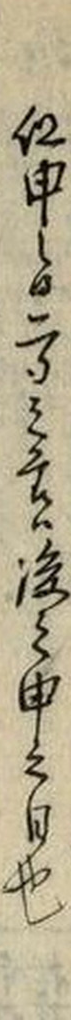但申之日二ツ之節ハ後之申之日也
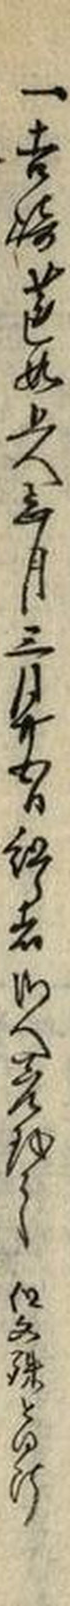一吉崎蓮如上人忌月三月廿五日組之者弐人差越之但文殊と同断
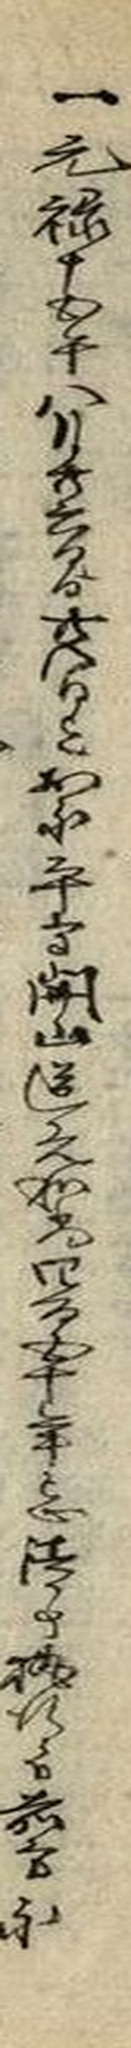一元禄十五午八月廿六日ゟ廿八日迄於永平寺開山道元和尚四百五十年忌法事執行ニ付前方永
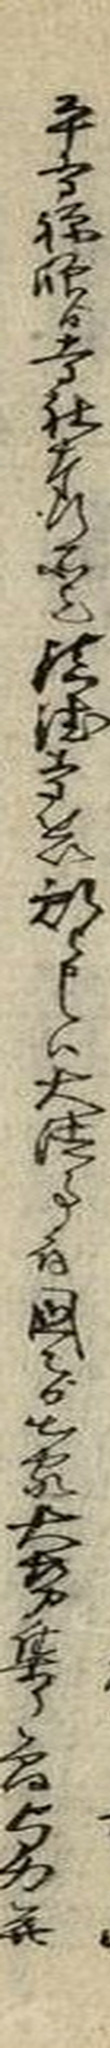平寺禅師ゟ寺社奉行所迄鎮徳寺を以願被申候ハ大法事ニ付国々ゟ出家大勢集り候間与力幷
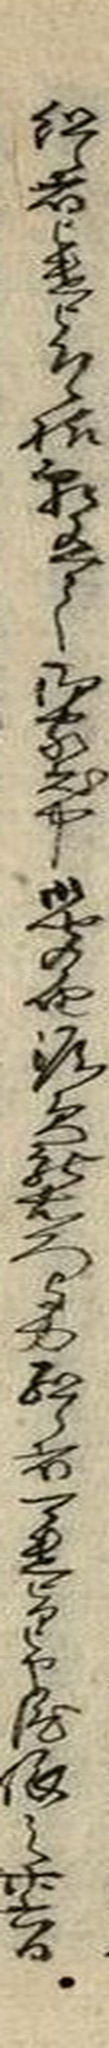組之者被遣被下候様願有之御家老中御聞届渥美新右衛門与力組之者可遣旨被申渡依之廿六日
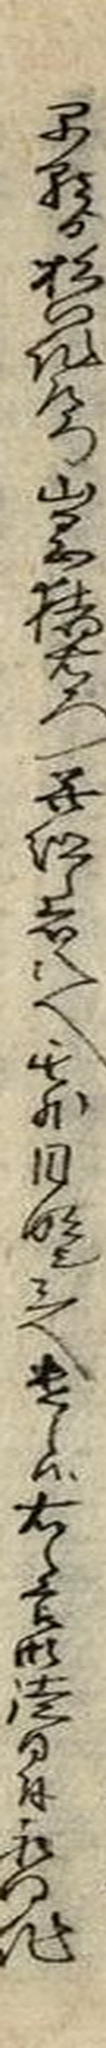早朝ゟ松田作左衛門山岡猪右衛門幷組之者八人其外目明シ三人遣之候右之節御徒目付永田作
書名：御国他国諸事之部
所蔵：福井県文書館 Fukui Prefectural Archives
